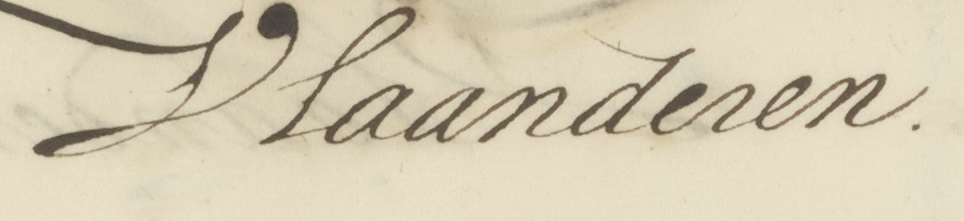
Vlaanderen.
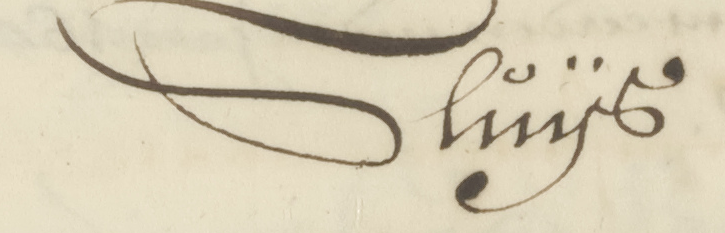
Sluijs
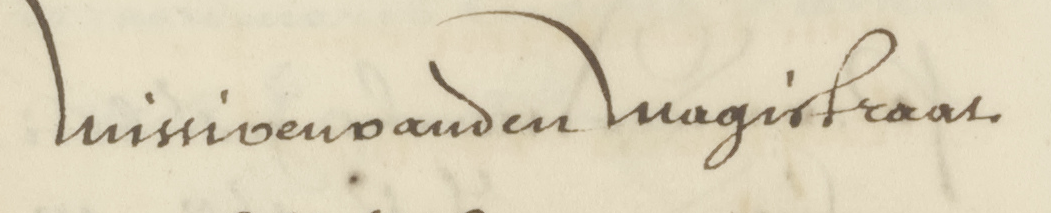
missiven vanden Magistraat
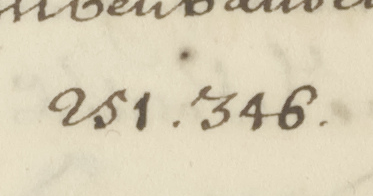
251. 346.
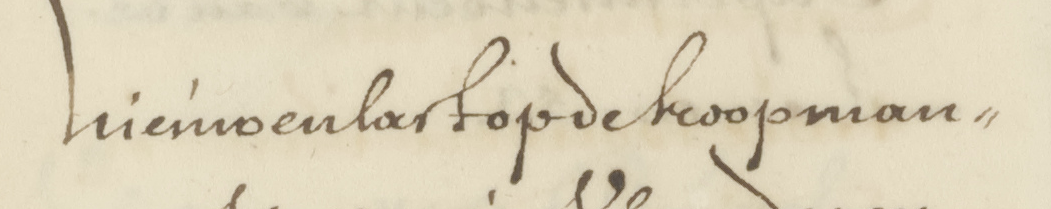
Nieuwen last op de koopman,,
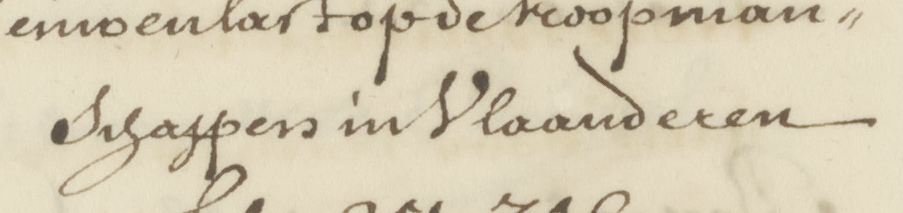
schappen in Vlaanderen
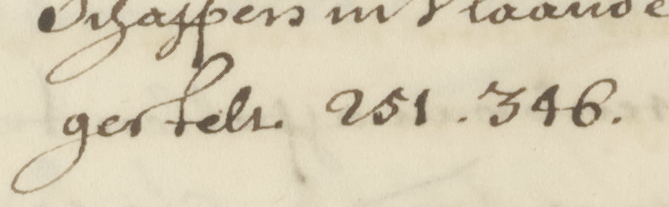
gestelt 251. 346.
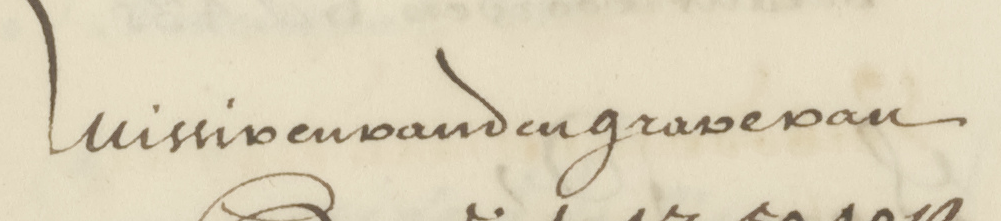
missiven vanden grave van
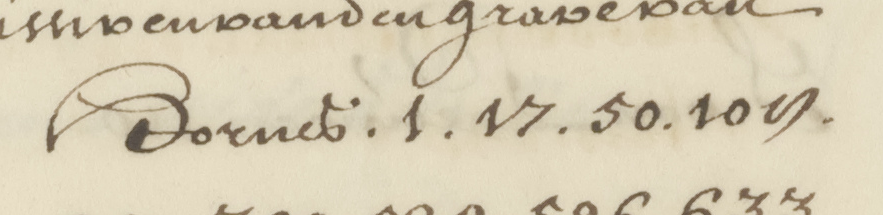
Hornes, 1, 17, 50, 108,
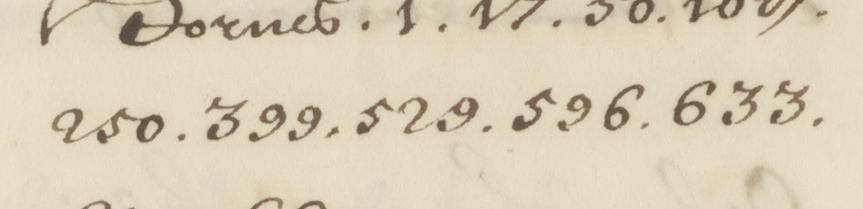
250, 399, 529, 596, 633,
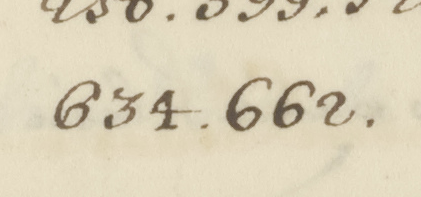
634, 662.
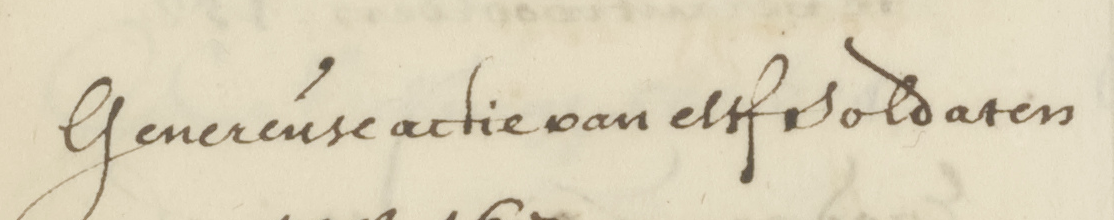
Genereuse actie van elff Soldaten
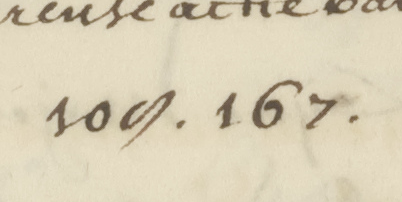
108, 167.
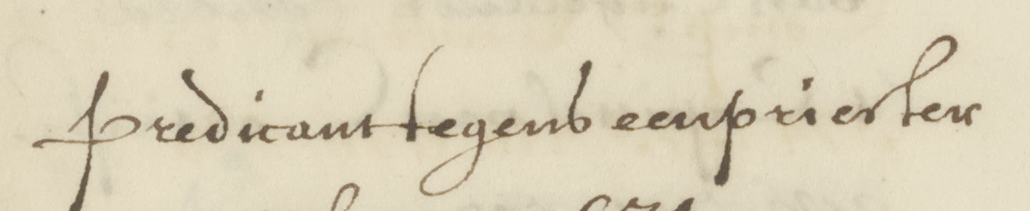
Predicant tegens een priester
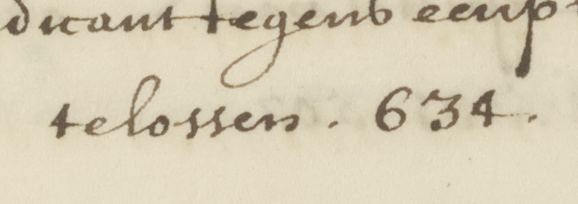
te lossen. 634.
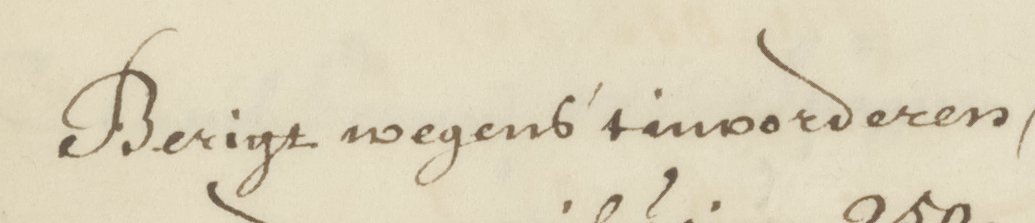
Berigt wegens 'tinvorderen
